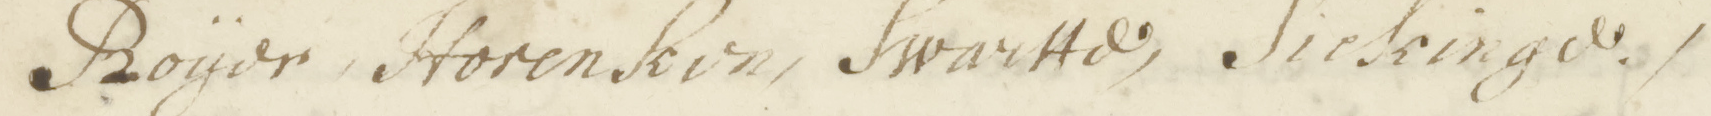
Roijer, Horenken, Swartte, Sickinge.
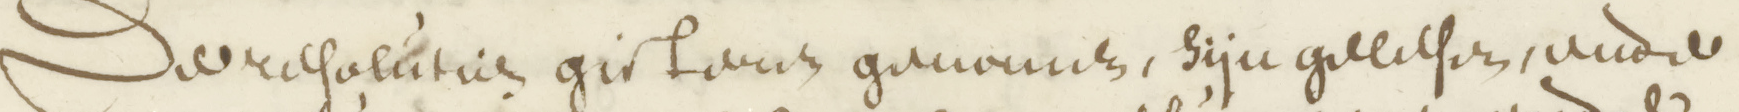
De resolutien gisteren genomen, sijn gelesen, ende
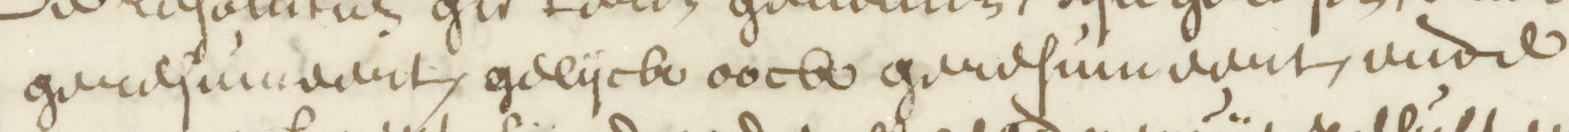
geresumeert, gelijck oock geresumeert, ende
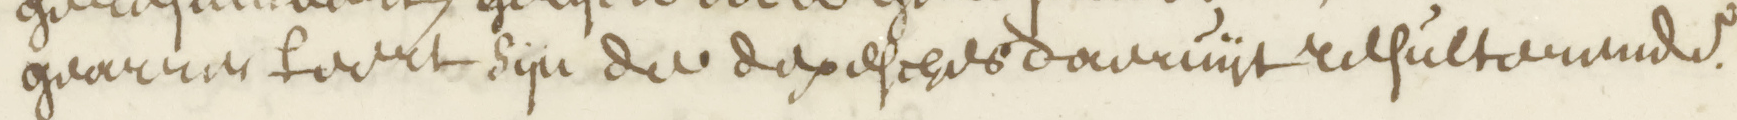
gearresteert sijn de depesches daeruijt resulterende.
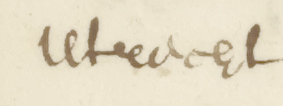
Utrecht
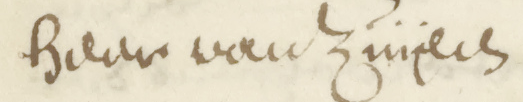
heer van Zuijlen
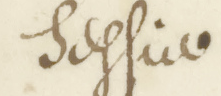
Sessie
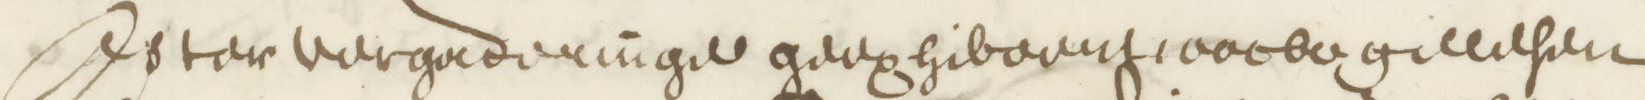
Is ter vergaderinge geexhibeert, oock gelesen
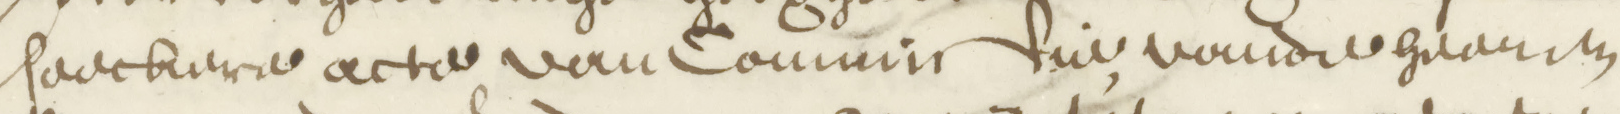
seeckere acte van Commissie vande heeren
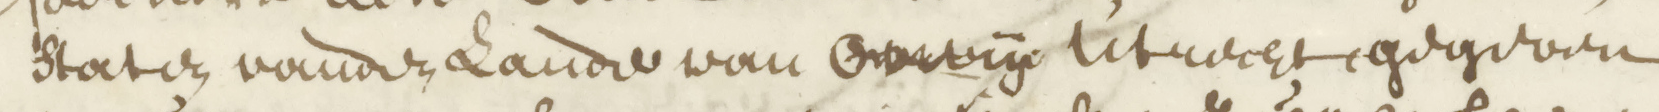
Staten vanden Lande van Overij Utrecht, gegeven
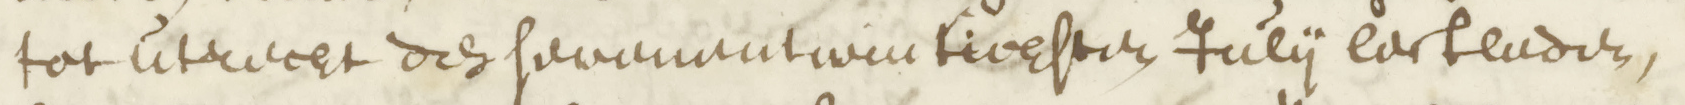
tot utrecht den sevenentwintichsten Julij lestleden,
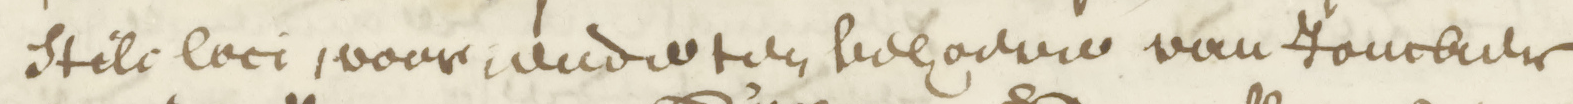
stilo loci, voor ende ten behoeve van Joncker
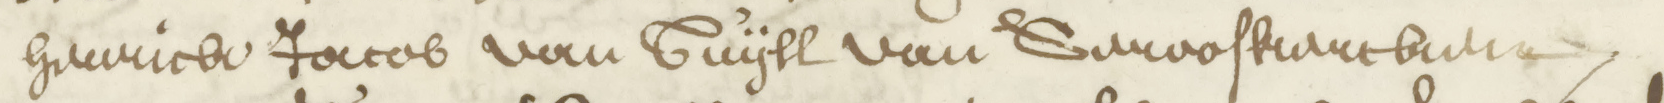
henrick Jacob van Tuijll van Serooskercken,
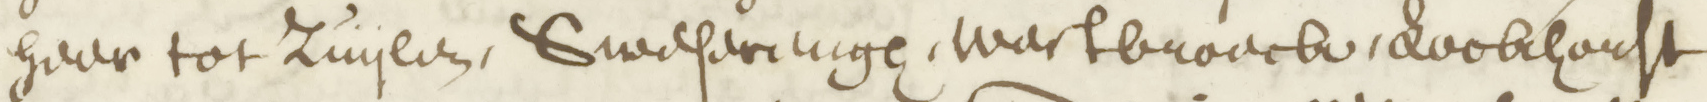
heer tot Zuijlen, Sweserenge, Westbroeck, Lockhorst
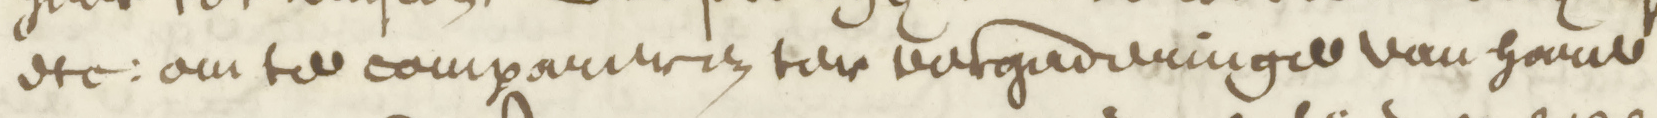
etc: om te compareren ter vergaderinge van hare
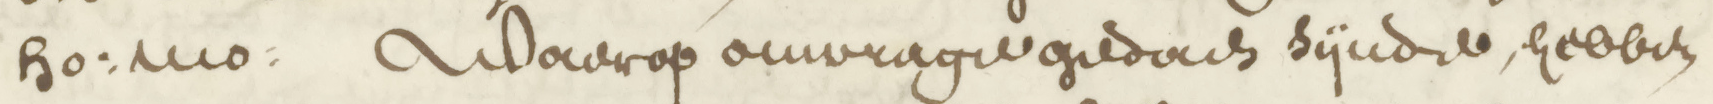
ho:mo: Waerop omvrage gedaen sijnde, hebben
